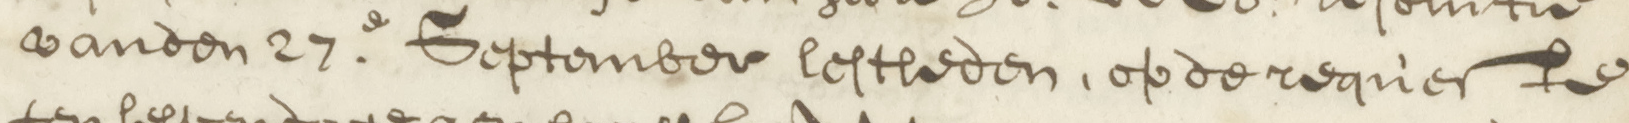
van den 27e. September lestleden, op de requeste
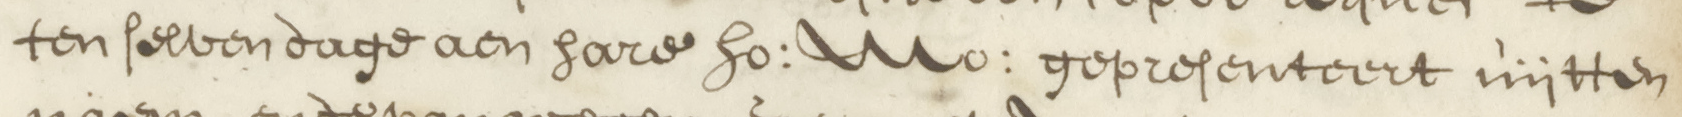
ten selven dage aen hare Ho:Mo: gepresenteert uijtten
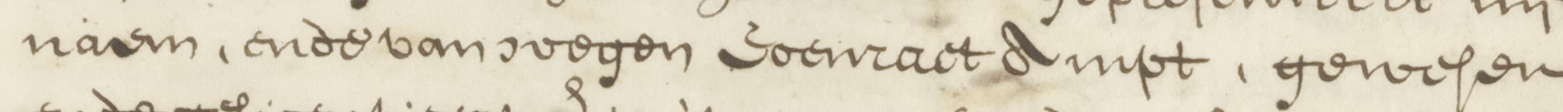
naem, ende van wegen Coenraet Ampt, gewesen
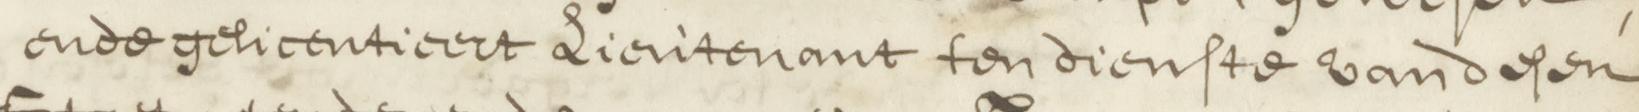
ende gelicentieert Lieutenant ten dienste van desen
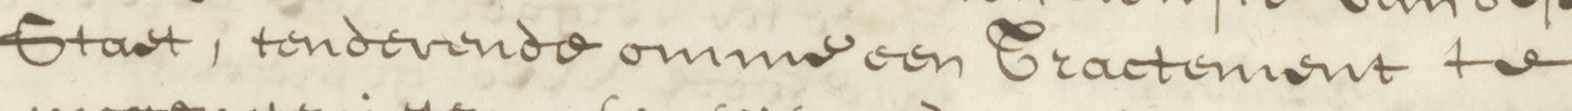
Staet, tenderende omme een Tractement te
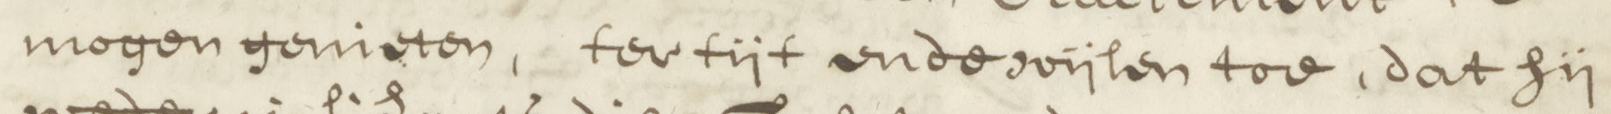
mogen genieten, ter tijt ende wijlen toe, dat hij
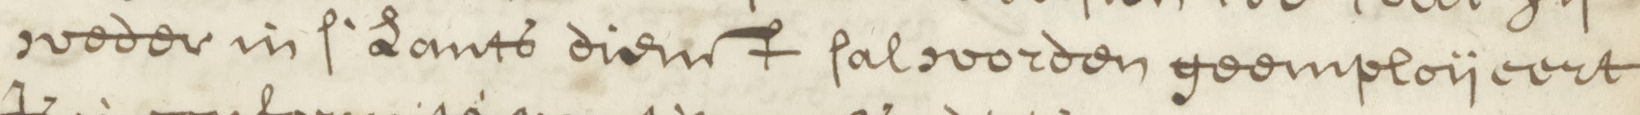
weder in s'Lants dienst sal worden geemploijeert;
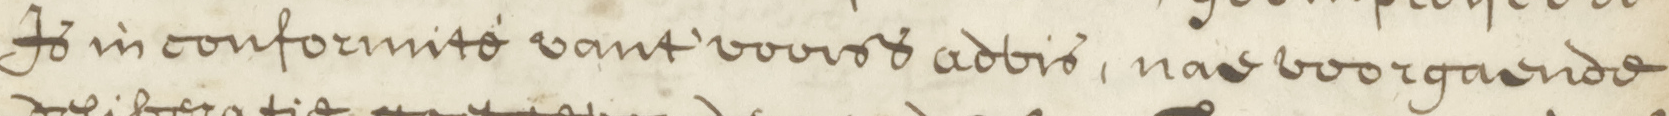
Is in conformité vant' voorsz advis, nae voorgaende
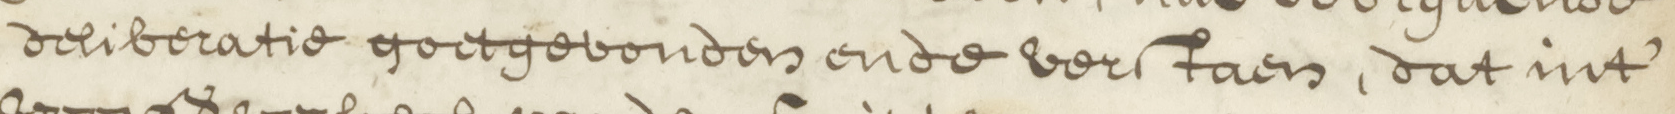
deliberatie goetgevonden end verstaen, dat int'
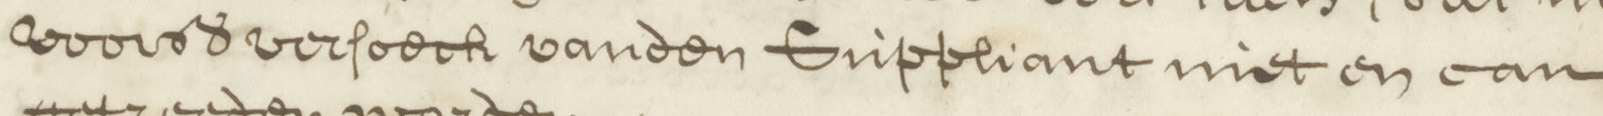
voorsz versoeck vanden Suppliant niet en can
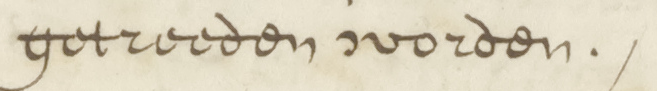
getreeden worden.
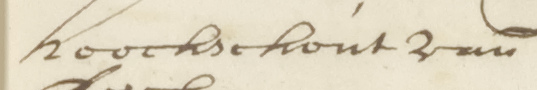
Hoochschout van
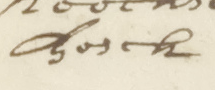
Bosch
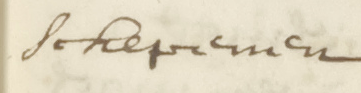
Schepenen
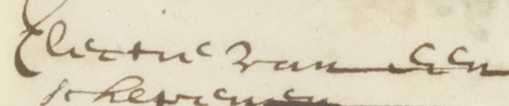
Electie van een
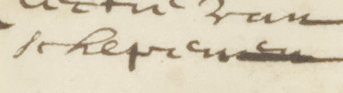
schepenen
